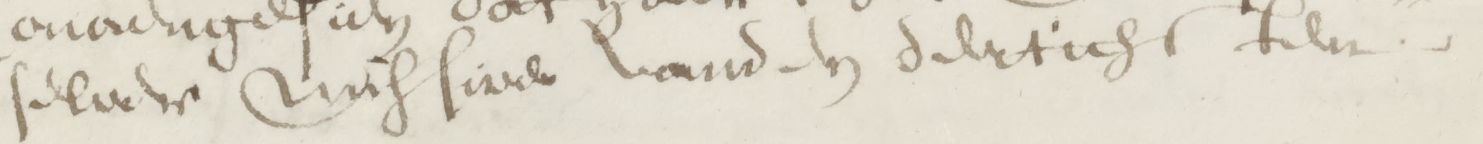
selver missive vanden dertichsten
